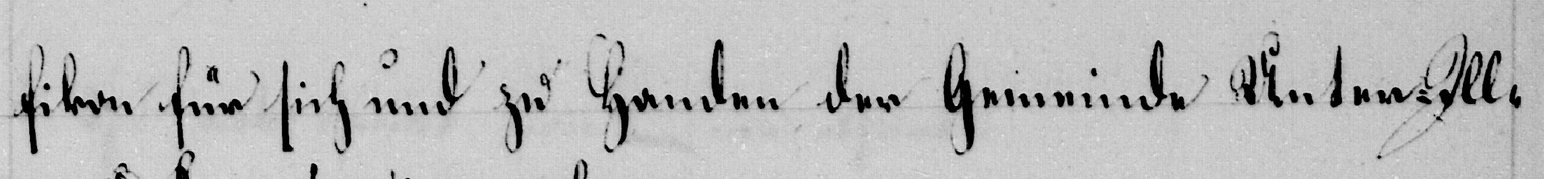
fikon für sich und zu Handen der Gemeinde Unter-Ill¬
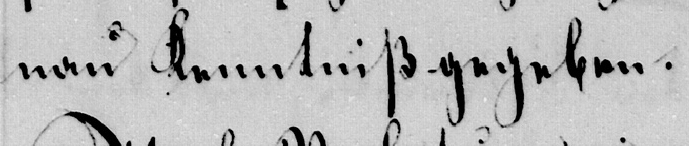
nau Kenntniß gegeben.
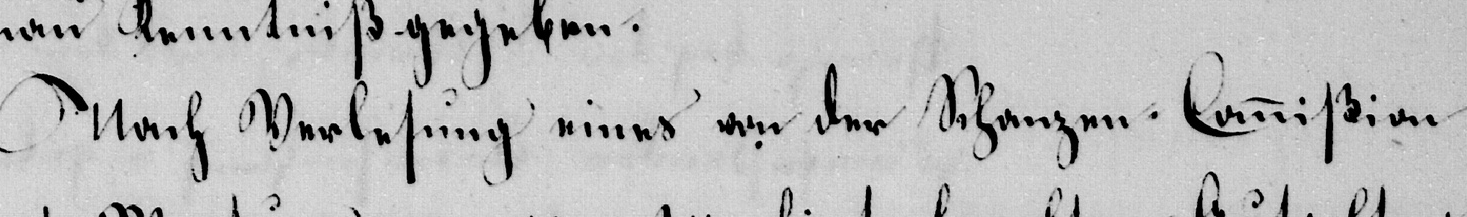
Nach Verlesung eines von der Schanzen-Commißion
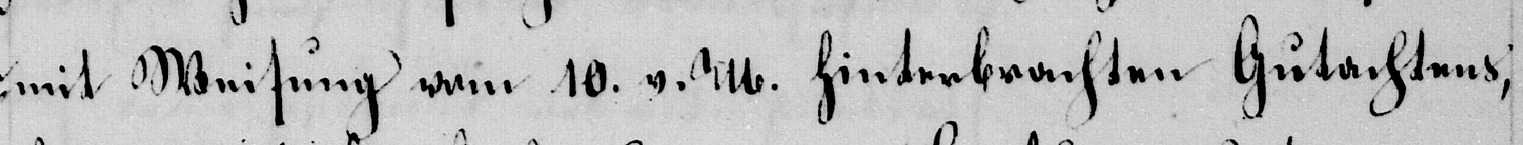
mit Weisung vom 7. d. M. hinterbrachten Gutachtens,
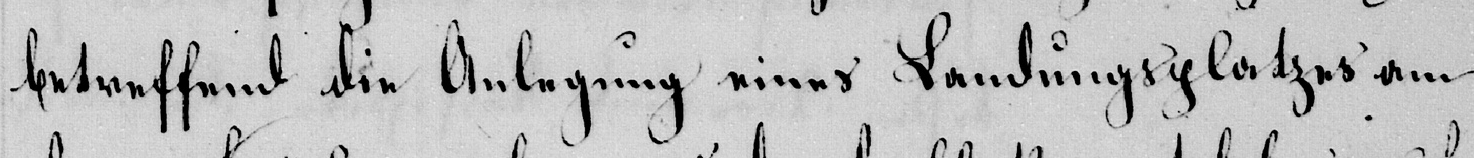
betreffend die Anlegung eines Landungsplatzes am
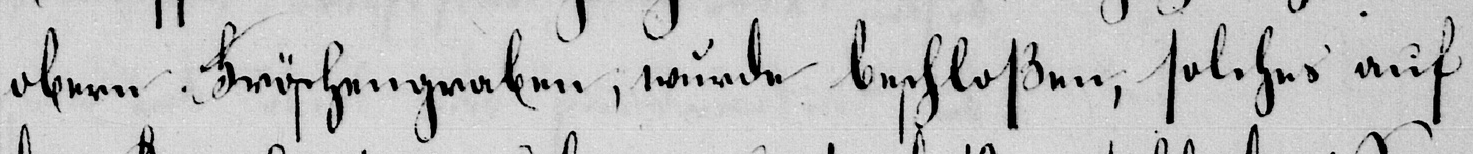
obern Fröschengraben, wurde beschloßen, solches auf
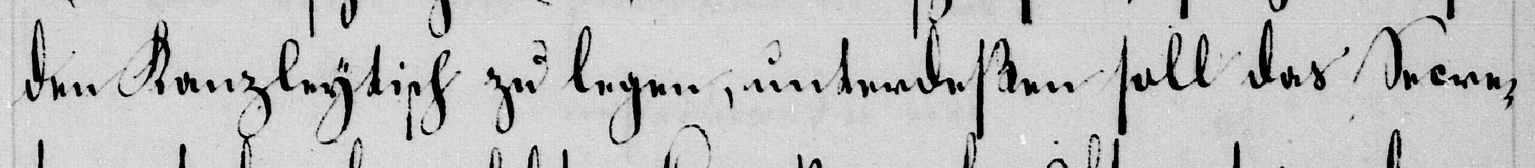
den Kanzleytisch zu legen, unterdeßen soll das Secre¬
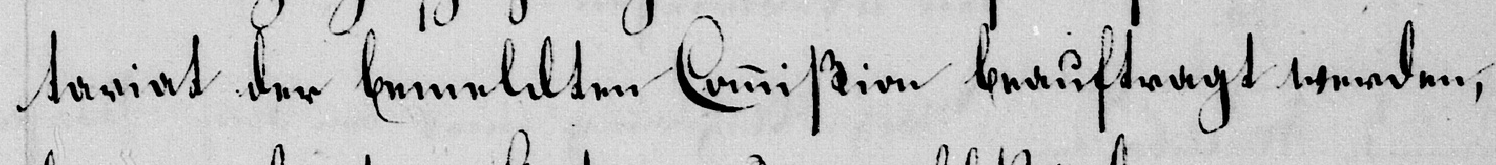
tariat der bemeldeten Commißion beauftragt werden,
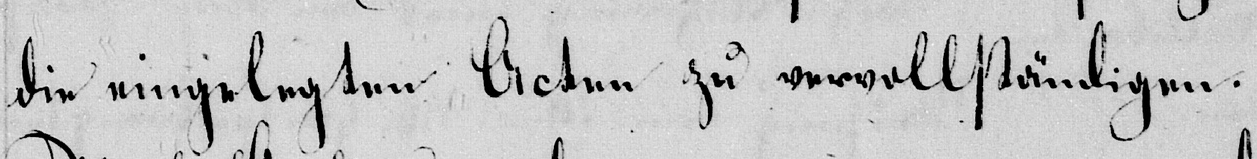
die eingelegten Acten zu vervollständigen.
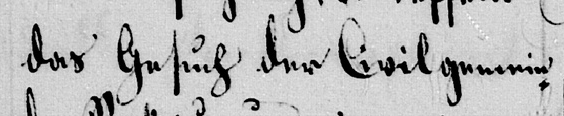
das Gesuch der Civilgemein¬
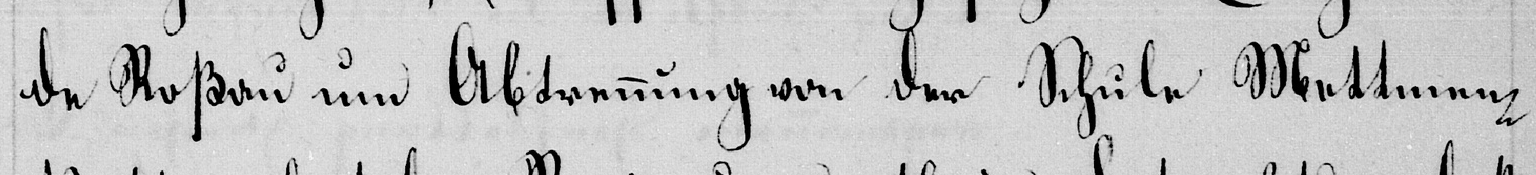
de Roßau um Abtrennung von der Schule Mettmen¬
